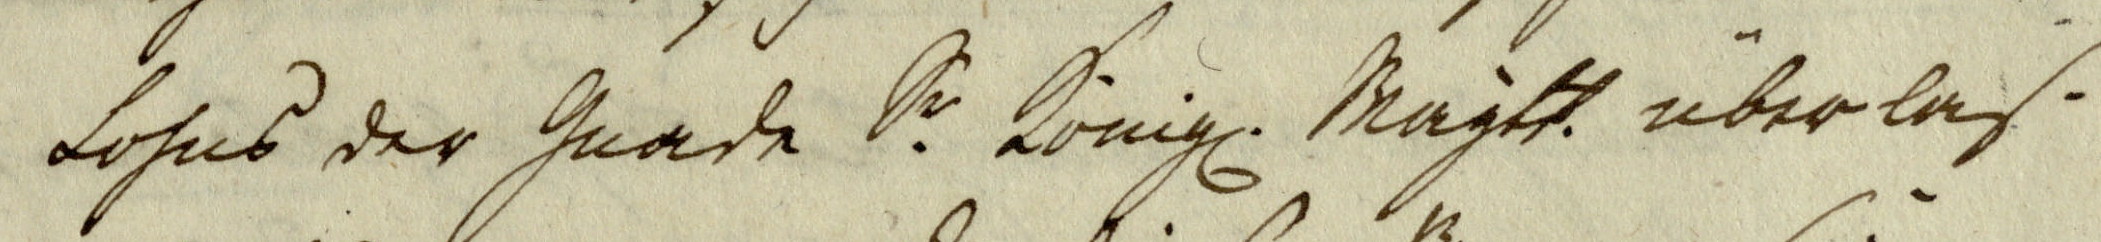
Lohns der Gnade Sr. Königl. Maÿst. überlas¬
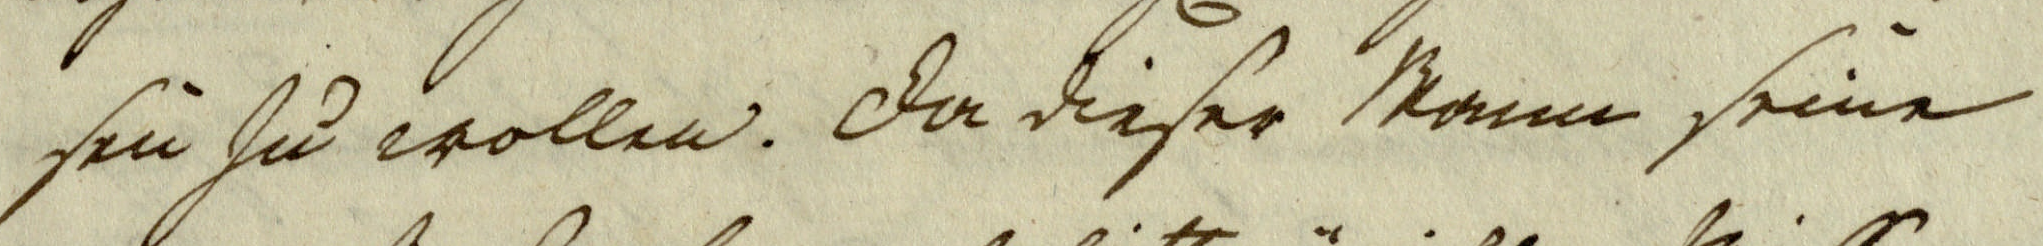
sen zu wollen. Da dieser Mann seine
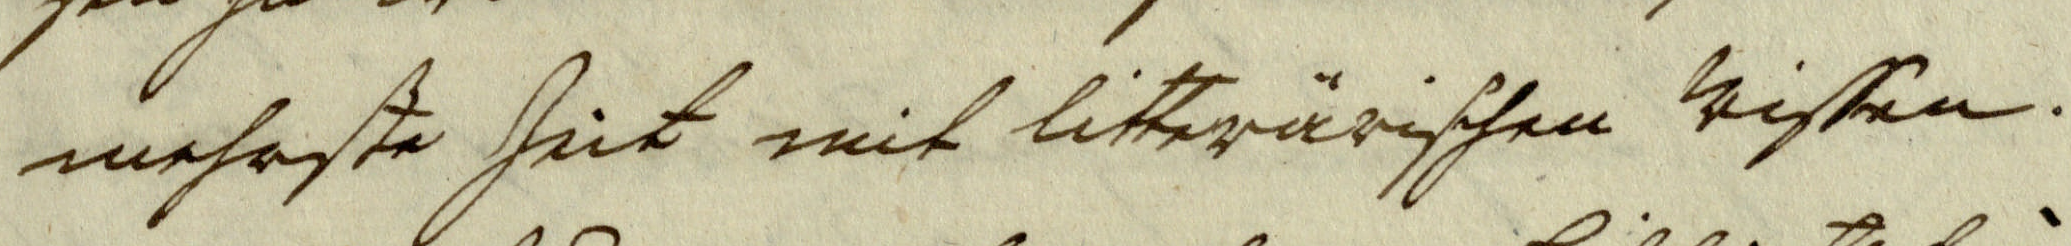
mehrste Zeit mit litterärischen Wissen¬
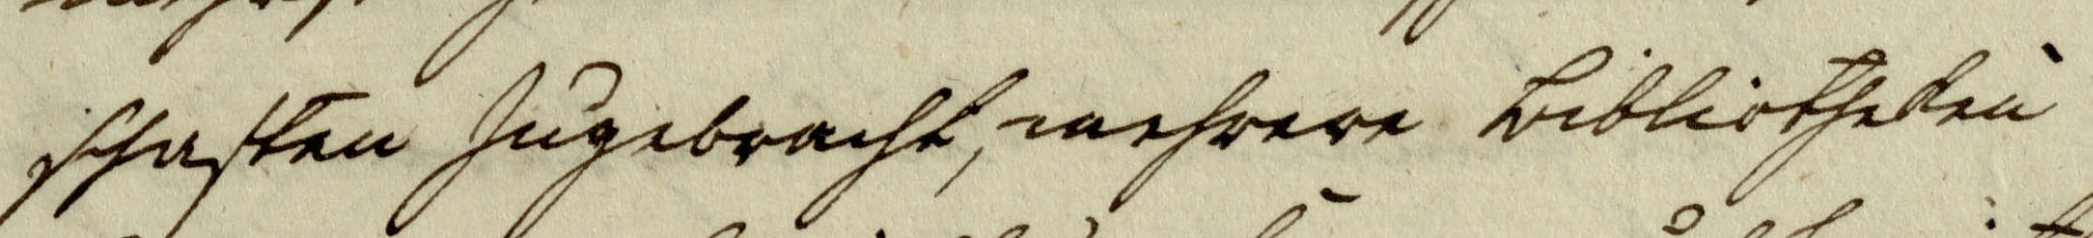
schaften zugebracht, mehrere Bibliotheken
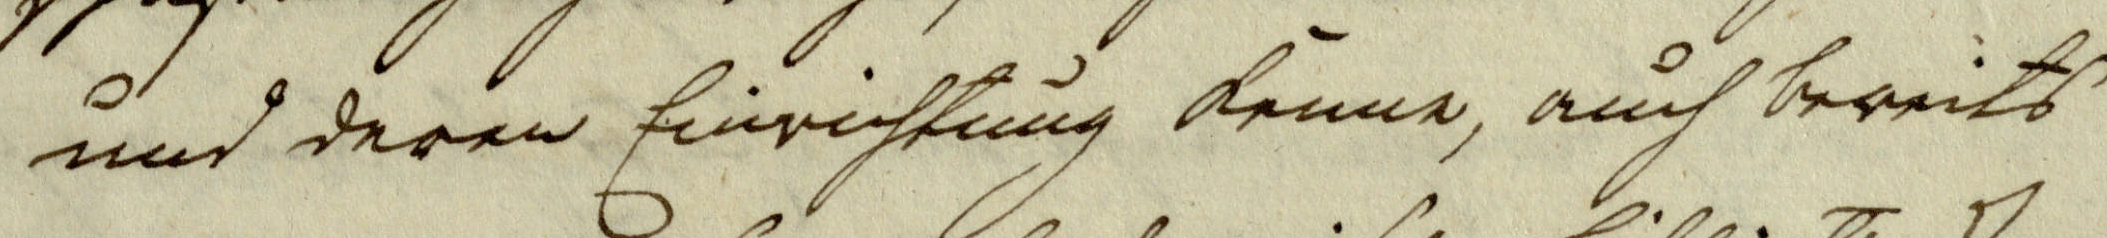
und deren Einrichtung kenne, auch bereits
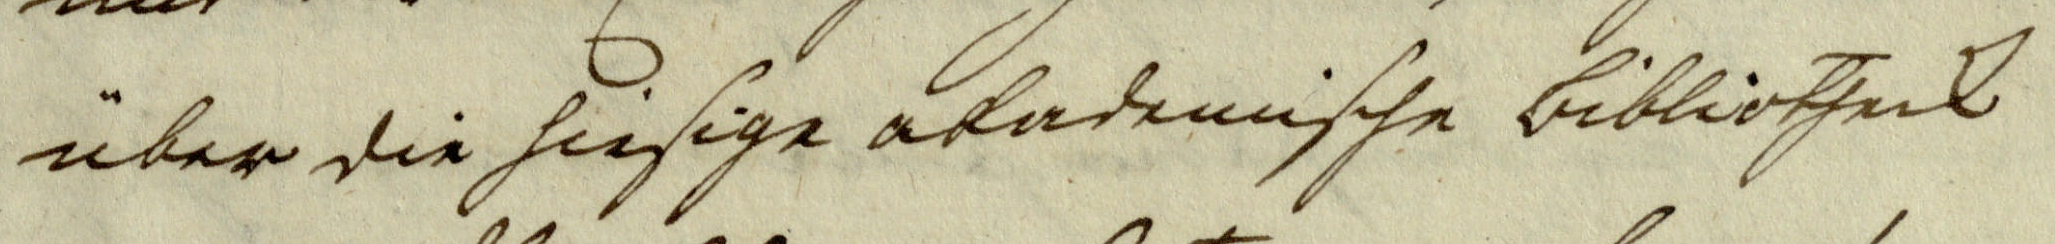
über die hiesige akademische Bibliothek
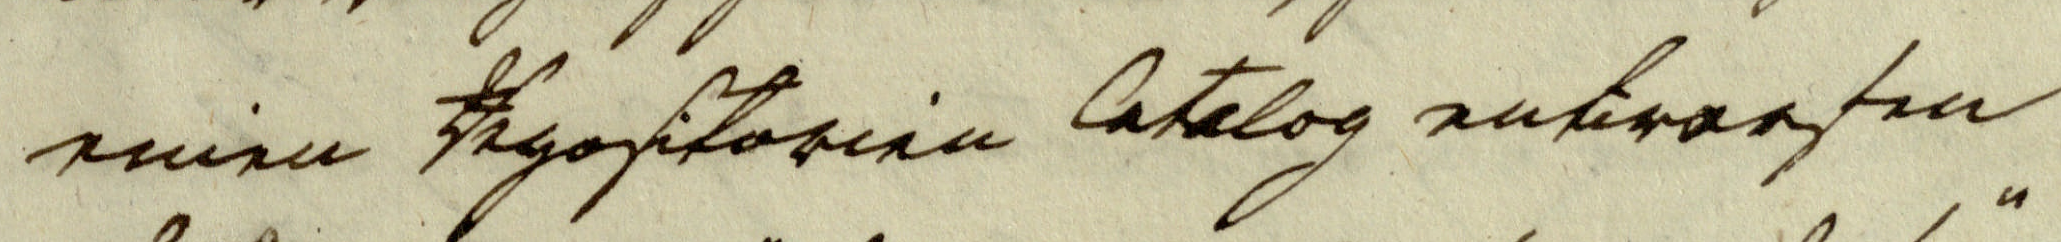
einen Repositorien Catalog entworfen
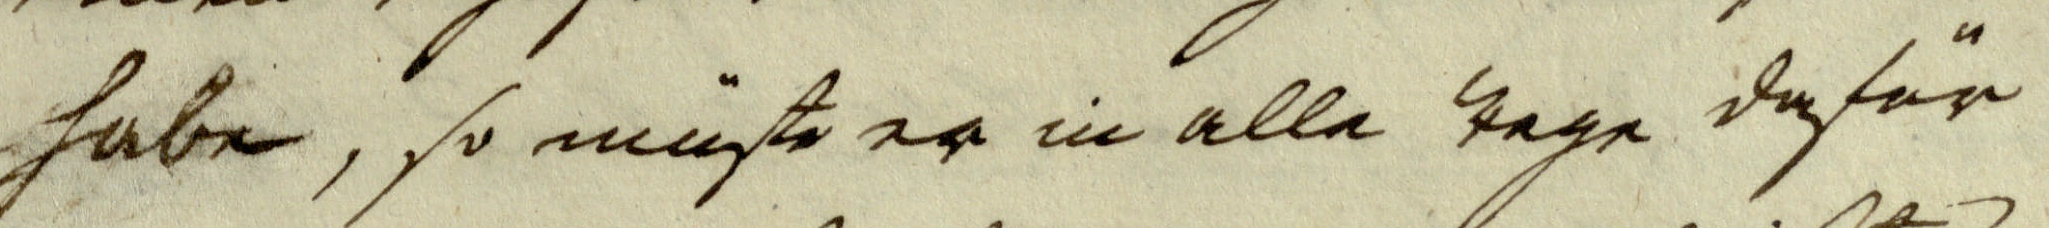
habe, so müsste er in alle Tage dafür
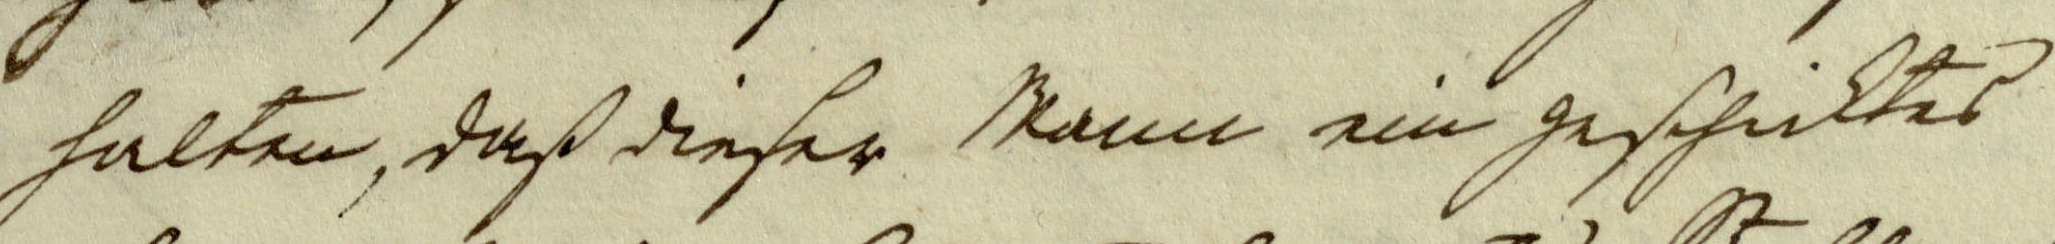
halten, daß dieser Mann ein geschicktes
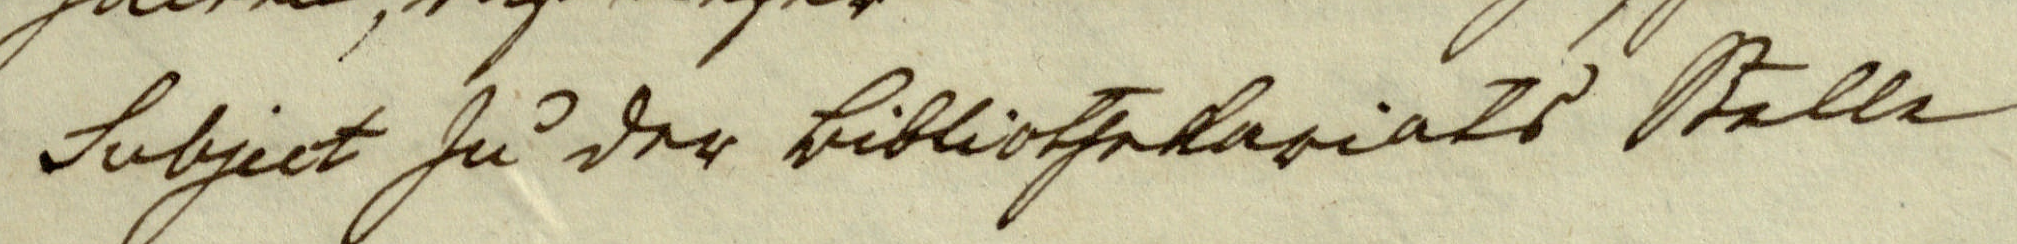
Subject zu der Bibliothekariats Stelle
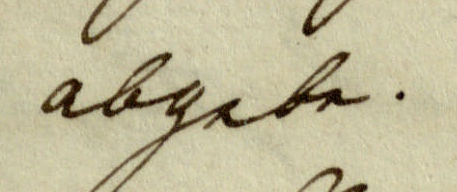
abgebe.
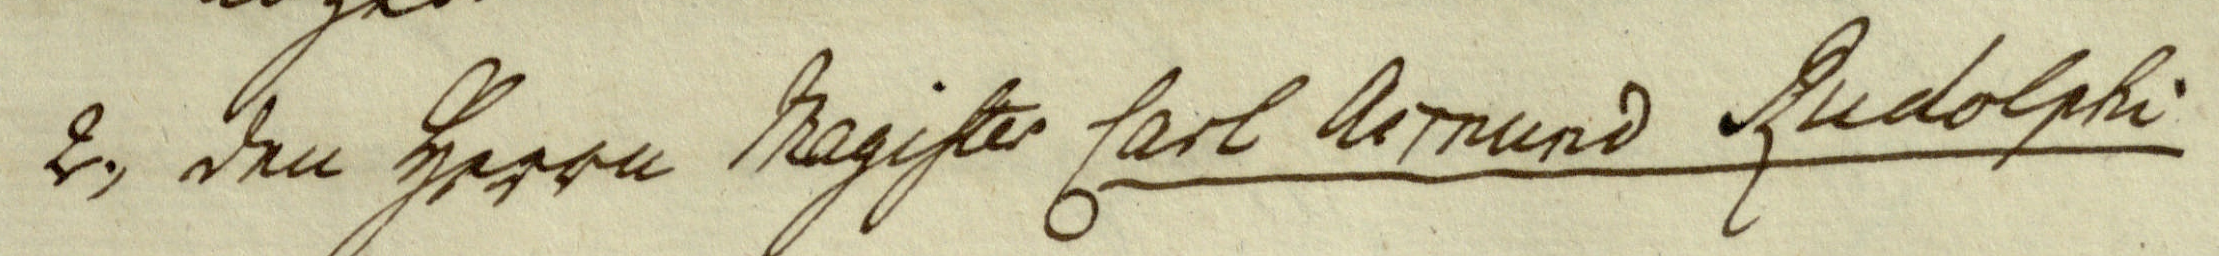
2., den Herrn Magister Carl Osmund Rudolphi
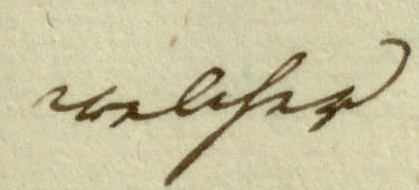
welcher
